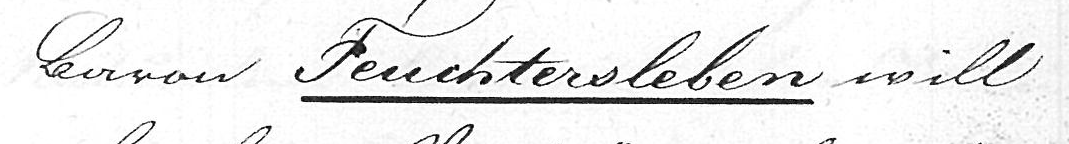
Baron Feuchtersleben will
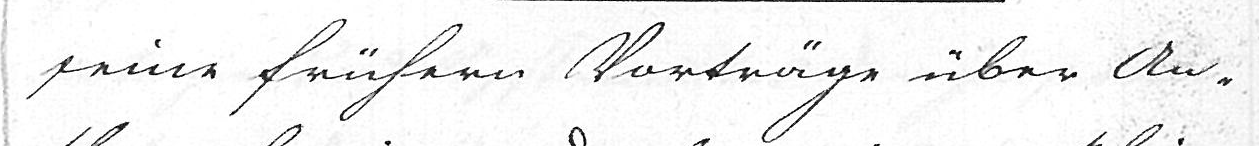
seine frühern Vorträge über An-
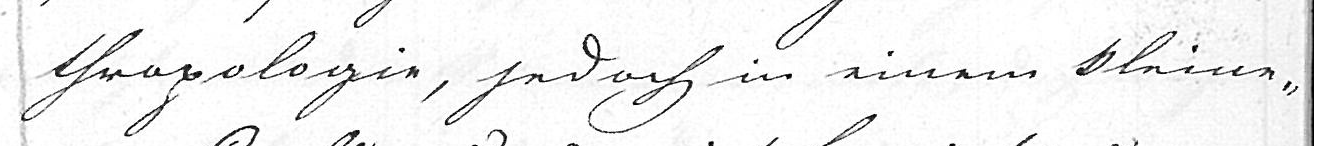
thropologie, jedoch in einem kleine-
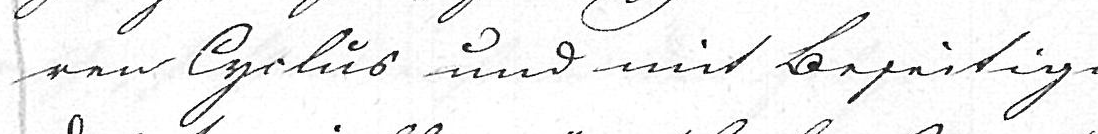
ren Cyclus und mit Beseitigung
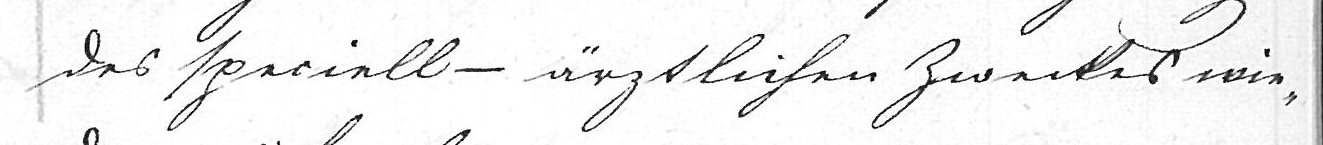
des speziell-ärztlichen Zweckes wie-
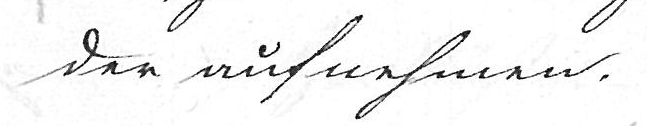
der aufnehmen.
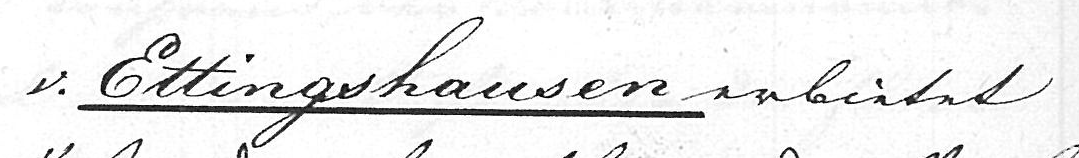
v. Ettingshausen erbietet
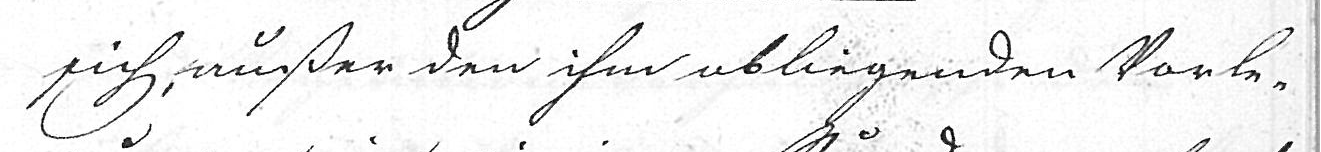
sich, außer den ihm obliegenden Vorle-
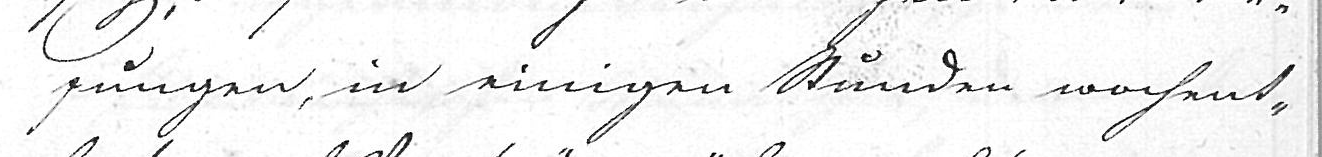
sungen, in einigen Stunden wochent-
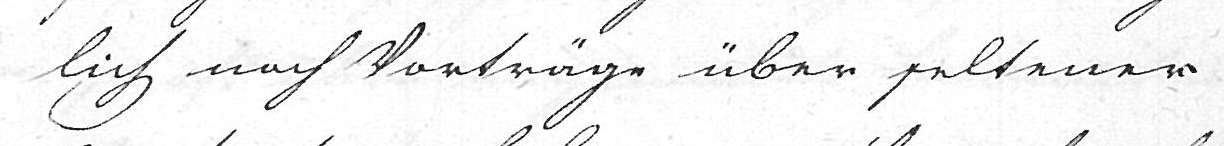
lich noch Vorträge über seltener
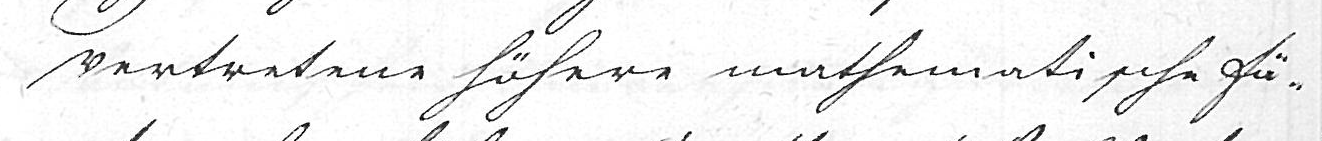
vertretene höhere mathematische Fä-
